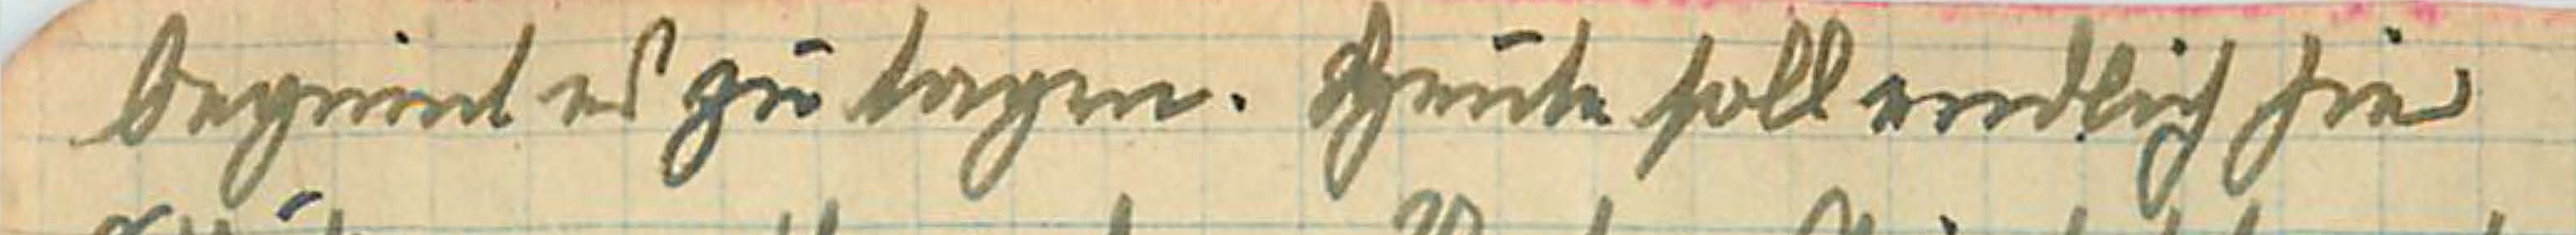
beginnt es zu tagen. Heute soll endlich hier
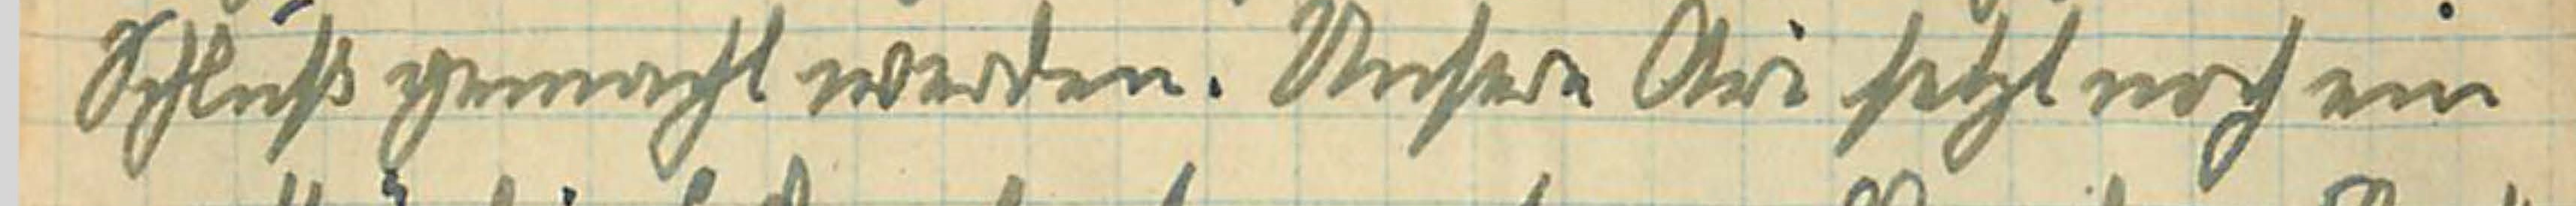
Schluß gemacht werden. Unsere Ari setzt noch ein
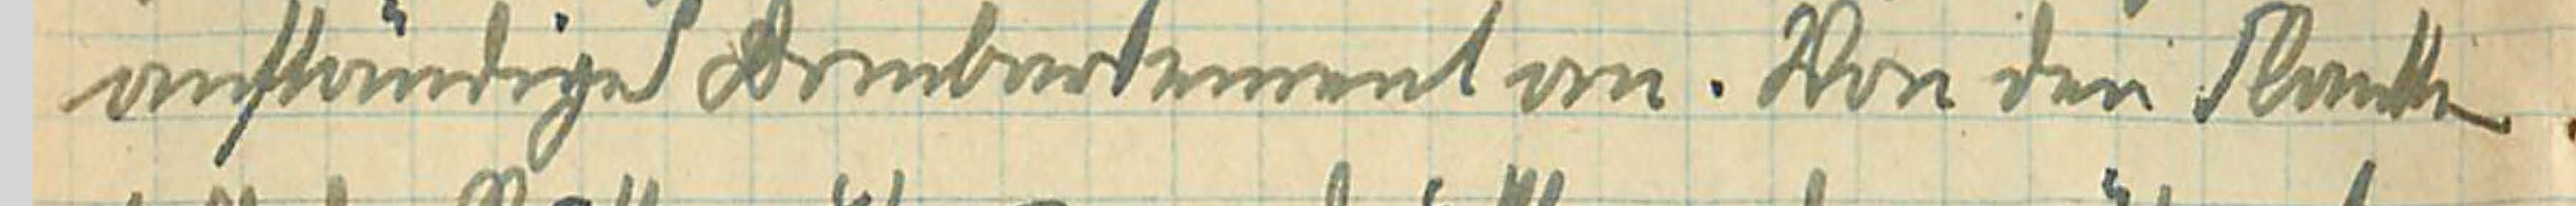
anständiges Bombardement an. Von den Flanken
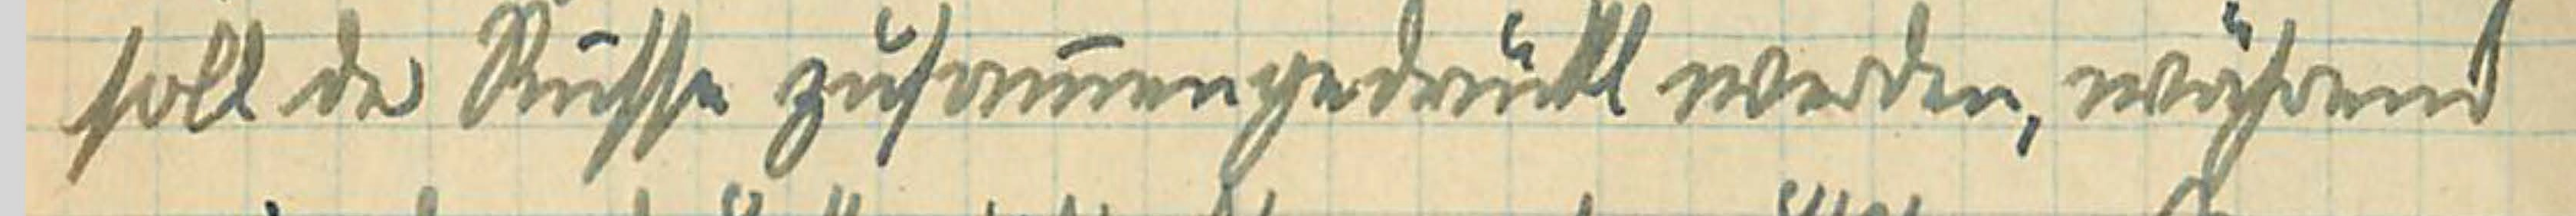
soll der Russe zusammengedrückt werden, während
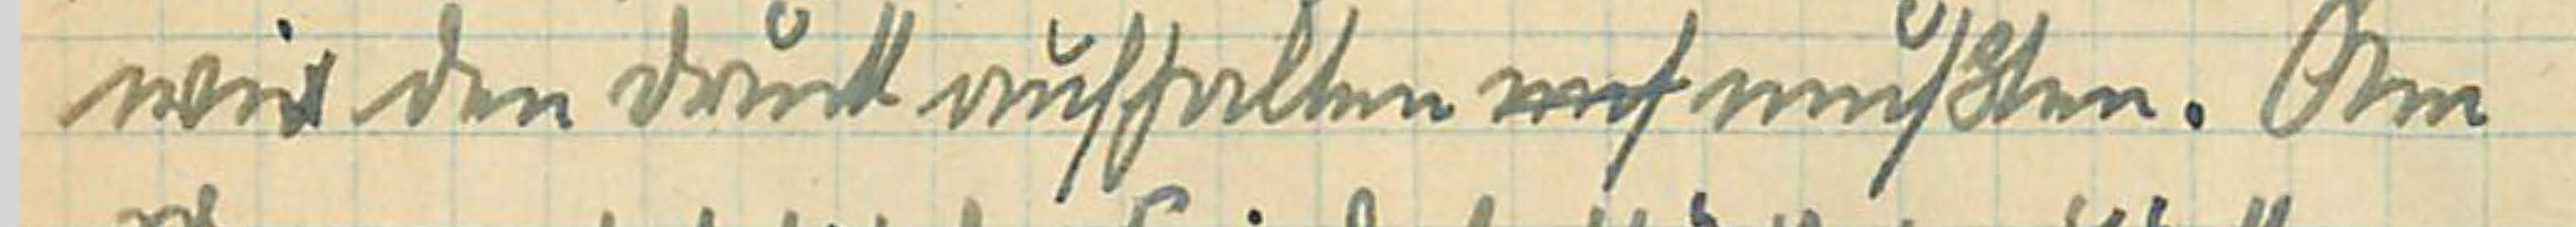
wir den Druck aufhalten nus mußten. Am
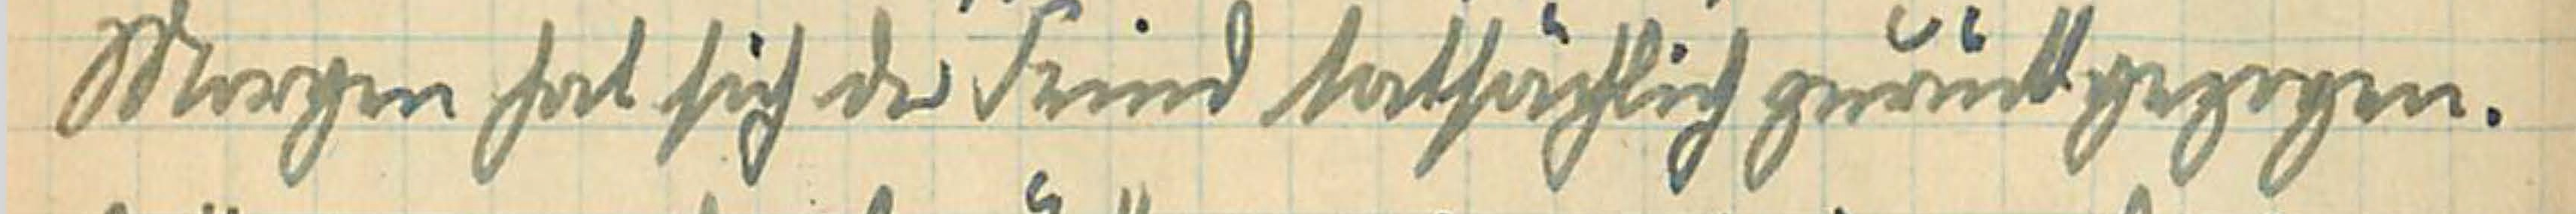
Morgen hat sich der Feind tatsächlich zurückgezogen.
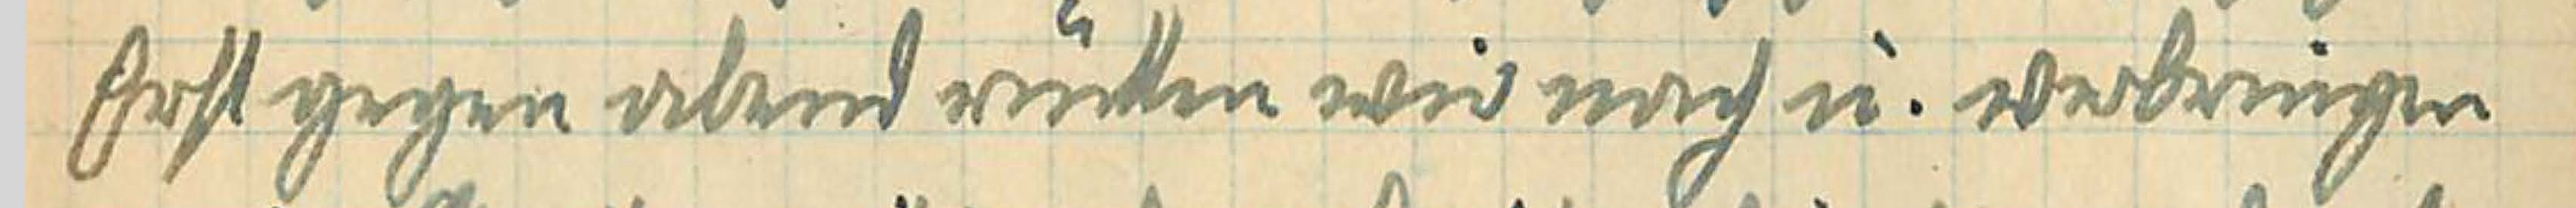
Erst gegen abend rücken wir nach u. verbringen
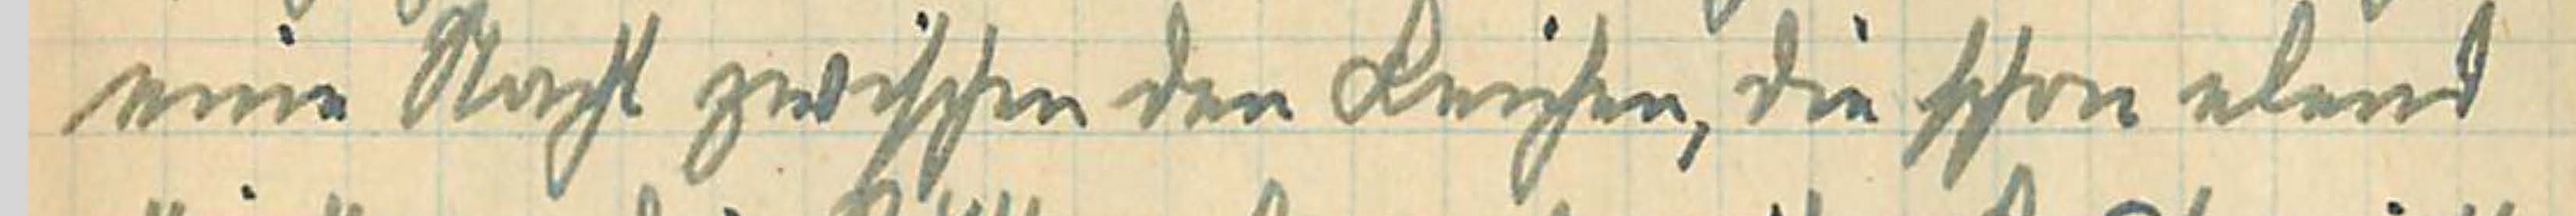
eine Nacht zwischen den Leichen, die schon elend
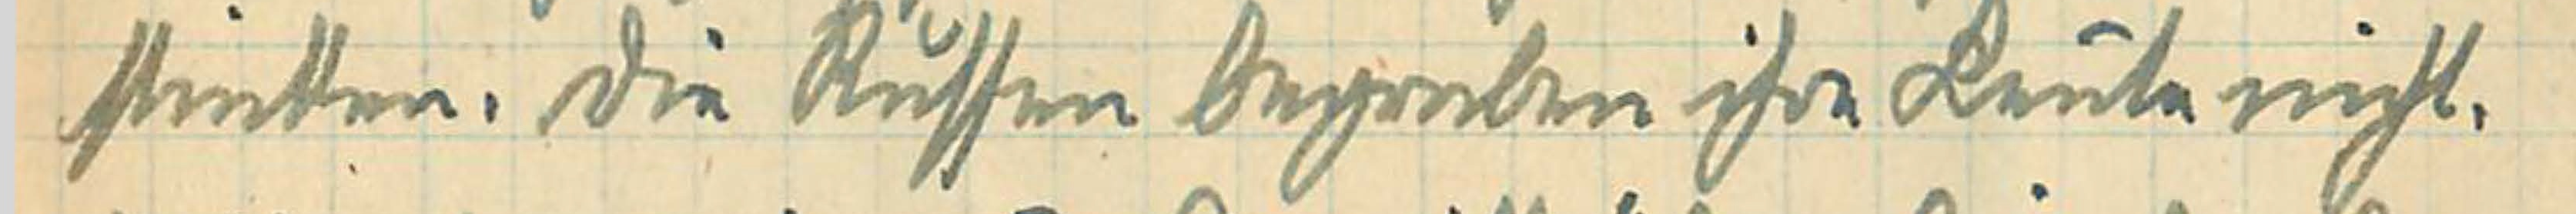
stinken. Die Russen begraben ihre Leute nicht.
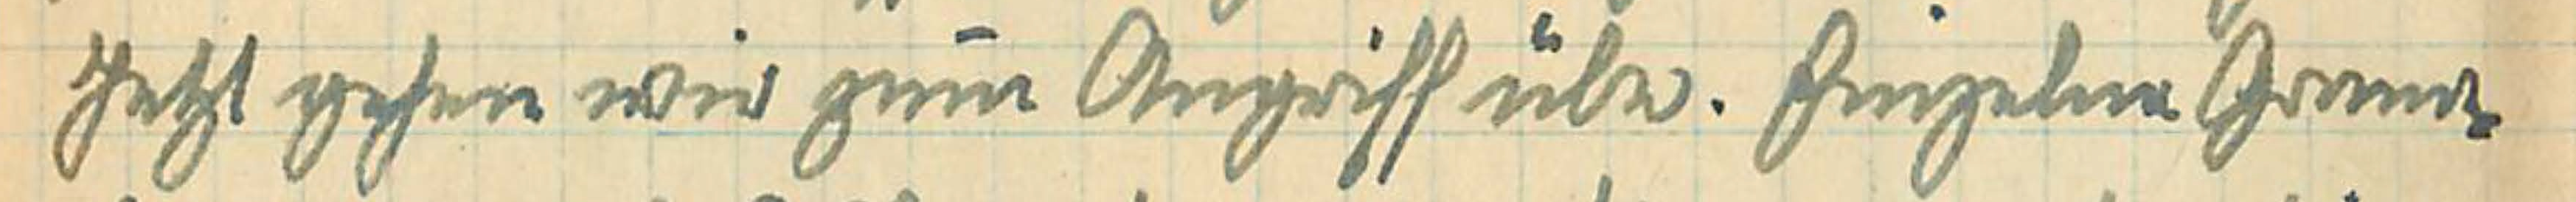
Jetzt gehen wir zum Angriff über. Einzelne Grana-
